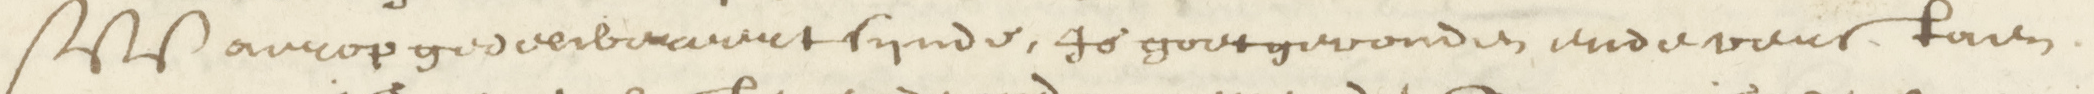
Waerop gedelibereert synde, Is goetgevonden ende verstaen
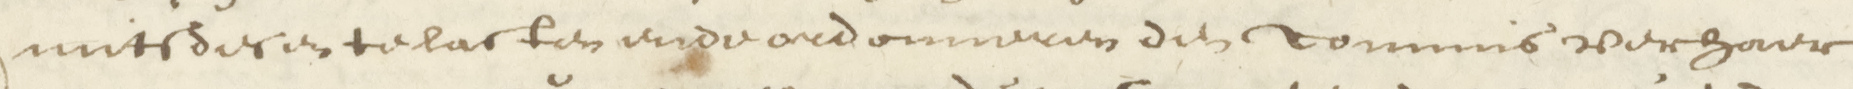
mitsdesen te lasten ende ordonneren den commis Verhaer
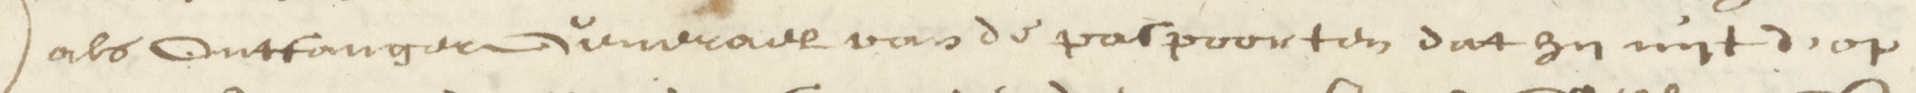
als Ontfanger Generael van de paspoorten dat hy uyt d'op,,
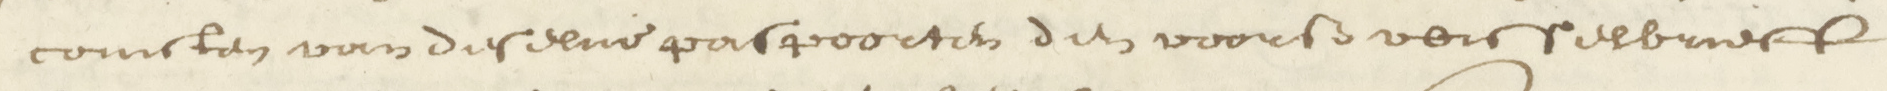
comsten van deselue paspoorten den voors wisselbrieff
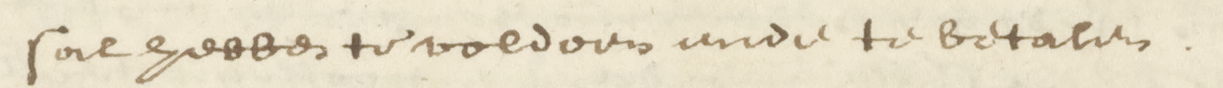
sal hebben te voldoen ende te betalen.
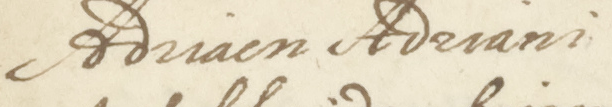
Adriaen Adriani
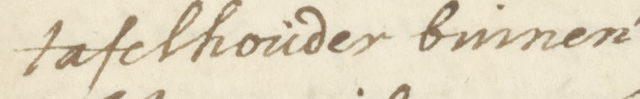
tafelhouder binnen
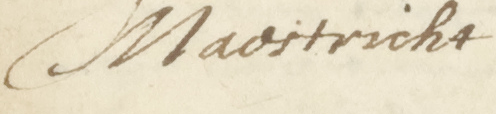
Maestricht
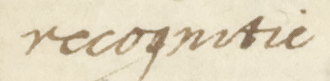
recognitie
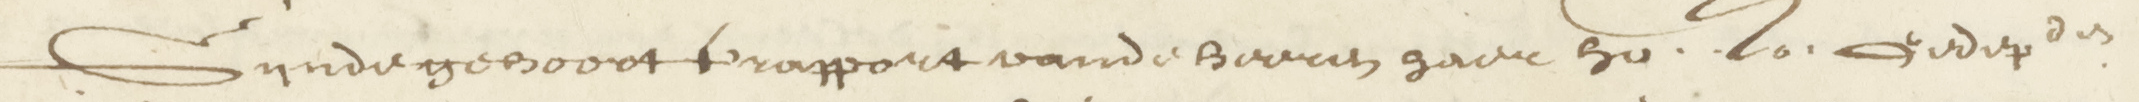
Synde gehoort t'rapport vande heeren haer ho:Mo: Gedepden.
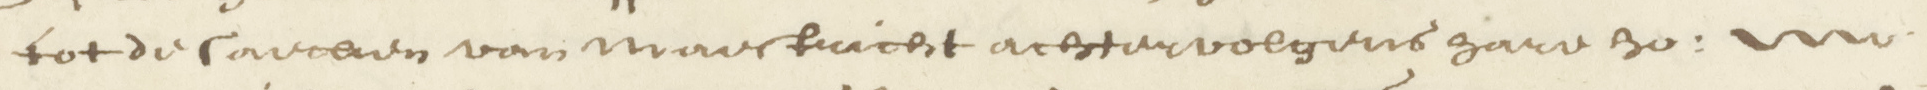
tot de saecken van Maestricht achtervolgens hare ho:Mo:
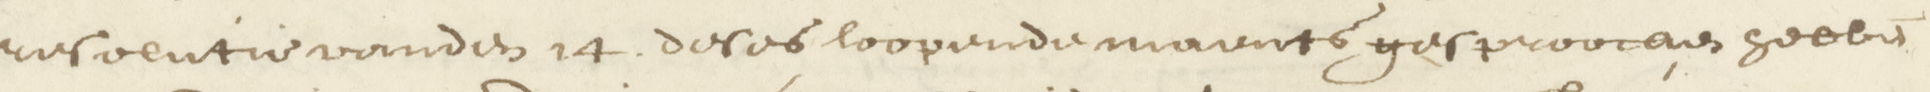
resolutie vanden 24. deses loopende maents gesproocken hebben
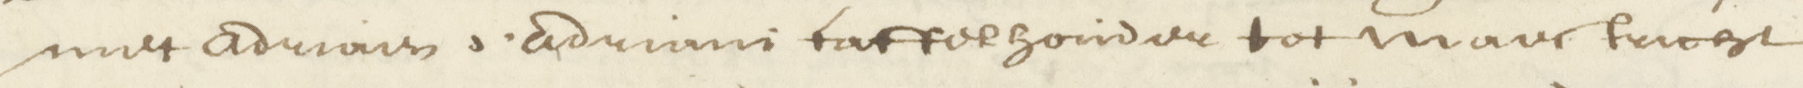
met Adriaen s'Adriani taffelhouder tot Maestricht
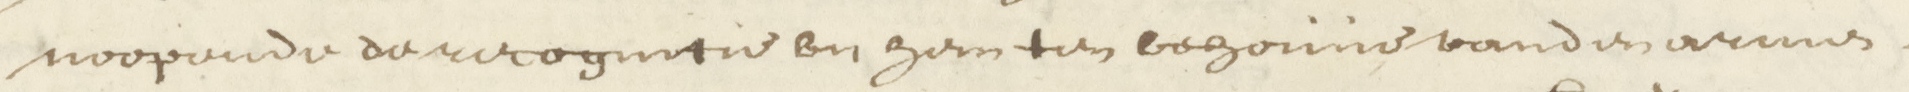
noopende de recognitie by hem ten behouue vanden armen
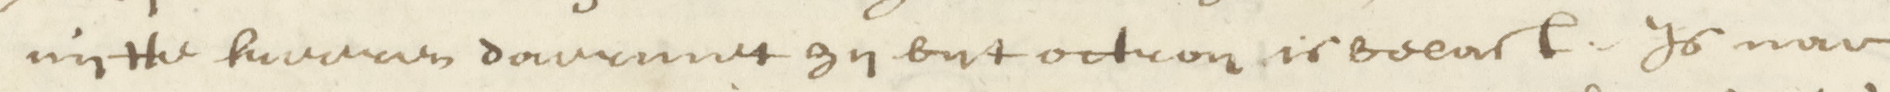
uytte keeren daermet hy byt octroy is belast. Is nae
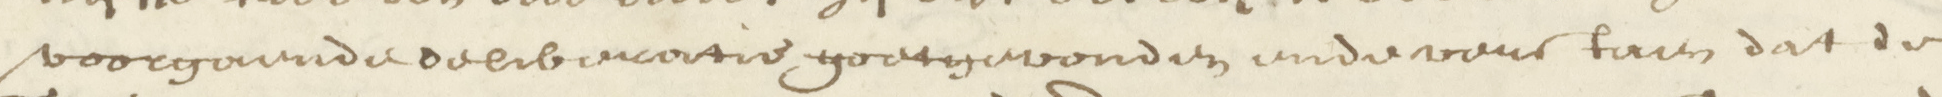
voorgaende deliberatie goetgevonden ende verstaen dat de
